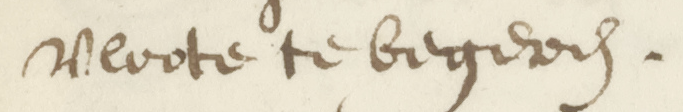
Vloote te begeven.
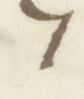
7.
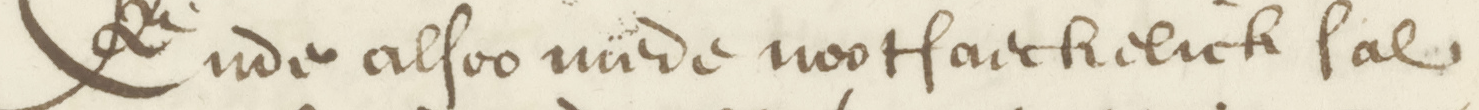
Ende alsoo mede nootsaeckelick sal
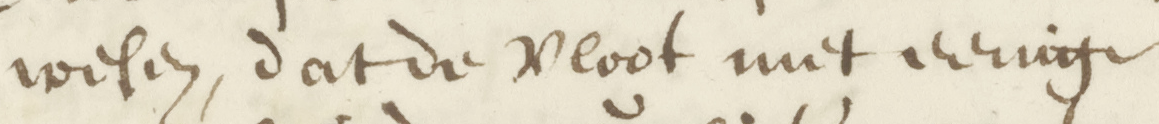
wesen, dat de Vloot met eenige
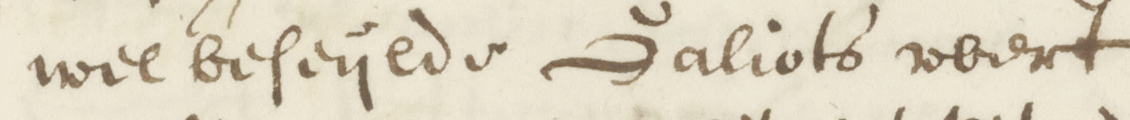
wel beseijlde Galiots wert
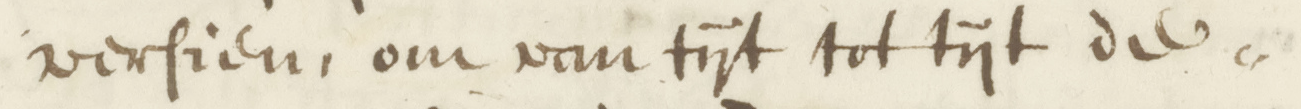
versien, om van tijt tot tijt de„
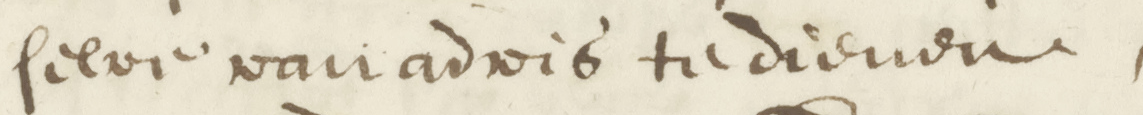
selve van advis te dienen,
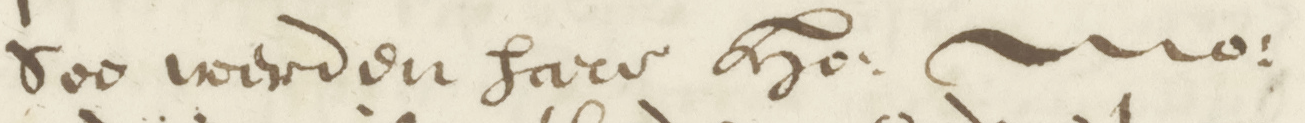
Soo werden hare Ho:mo:
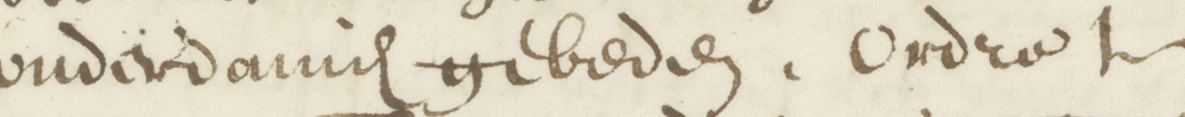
onderdanen gebeden, ordre te
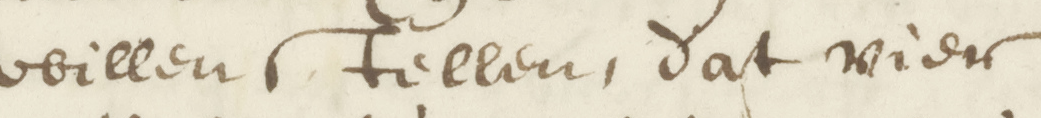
willen stellen, dat vier
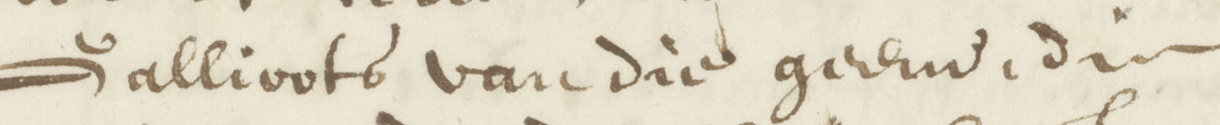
Gallioots van die geene, die
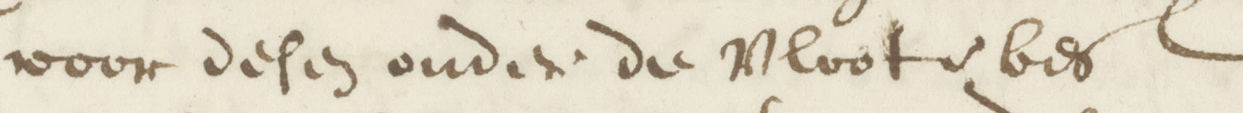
voor desen onder de Vloote best
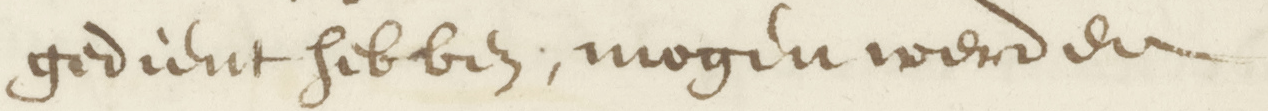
gedient hebben, mogen werden
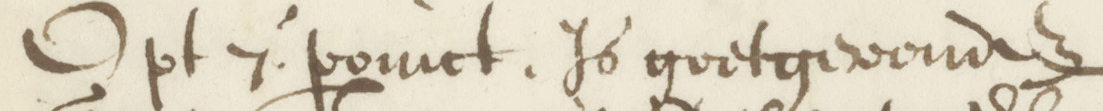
Opt 7e poinct, Is goetgevonden
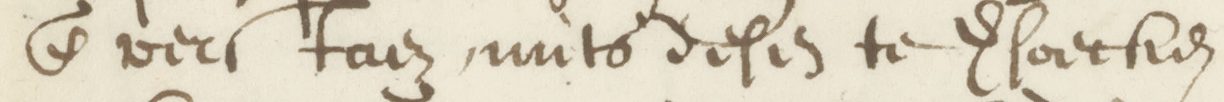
& verstaen, mits desen te vsoecken
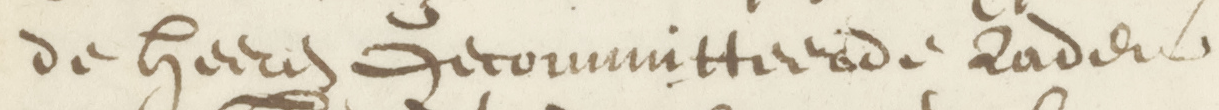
de Heeren Gecommiteerde raden
